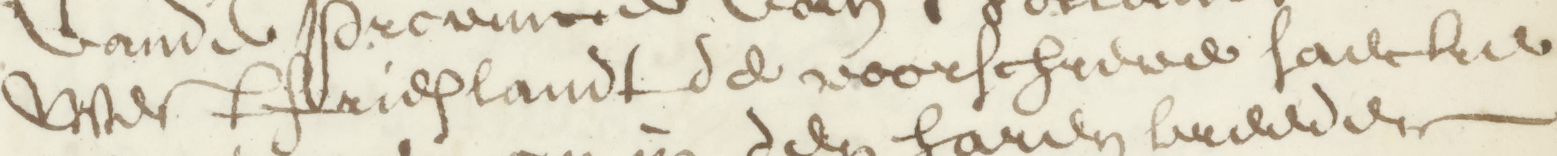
Westfrieslandt de voorschreve saecke
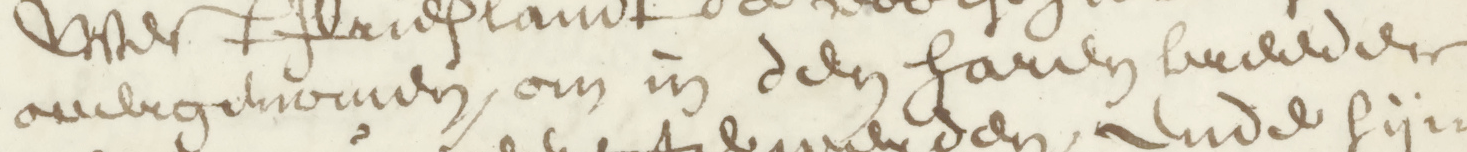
overgenomen, om in den haren breeder
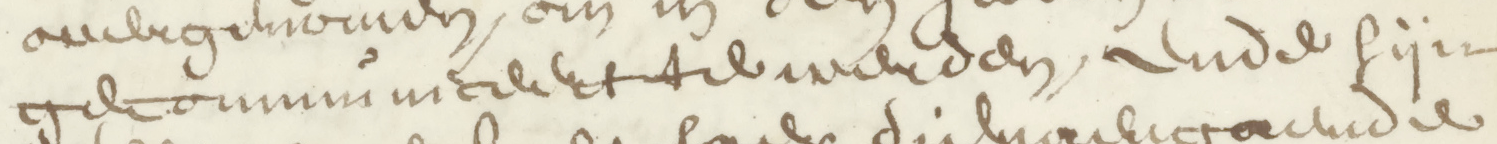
gecommuniceert te werden, ende sijn
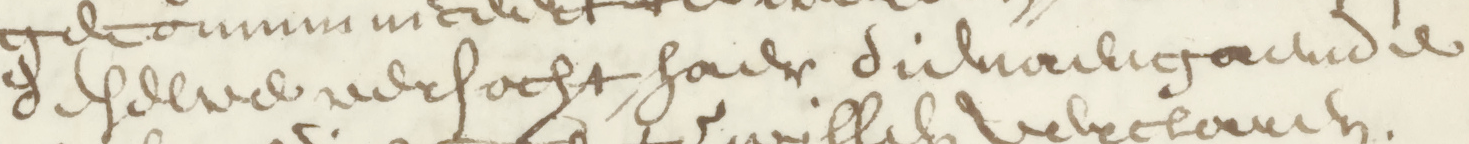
deselve versocht haer dienaengaende
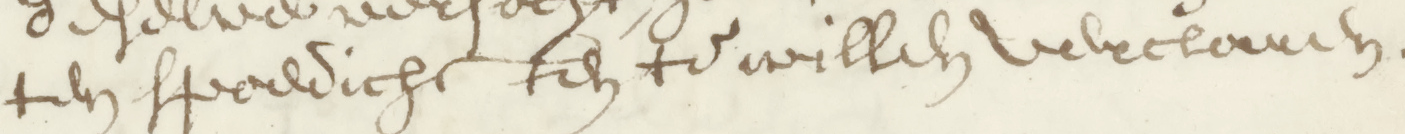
ten spoedichsten te willen verclaren.
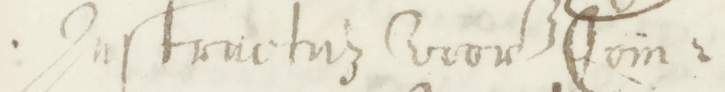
Instructien voor Com„
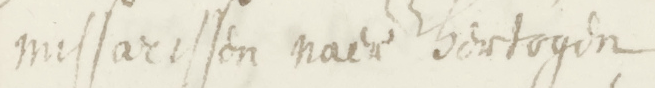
missarissen naer hertogen
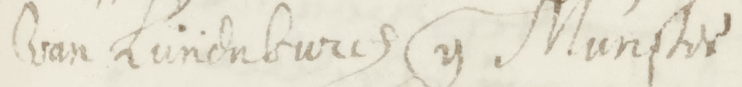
van Lünenburch & Munster
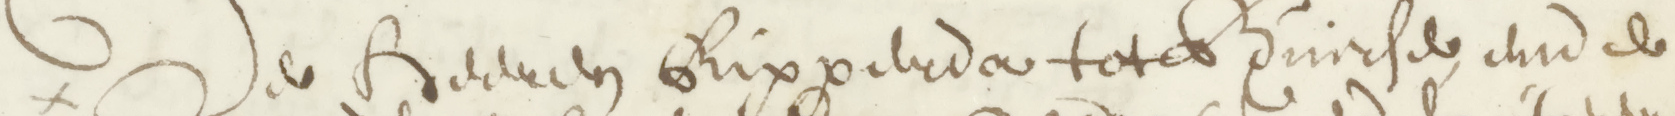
De Heeren Ripperda tot Buirse, ende
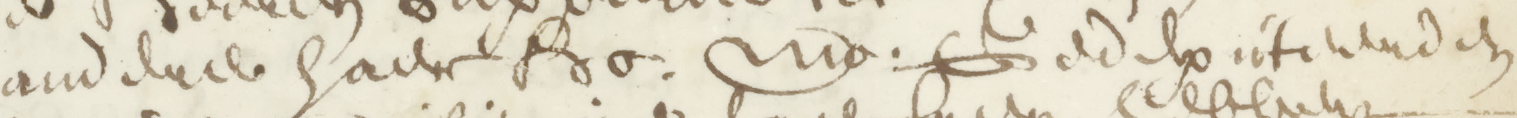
andere haer Ho:Mo: Gedeputeerden
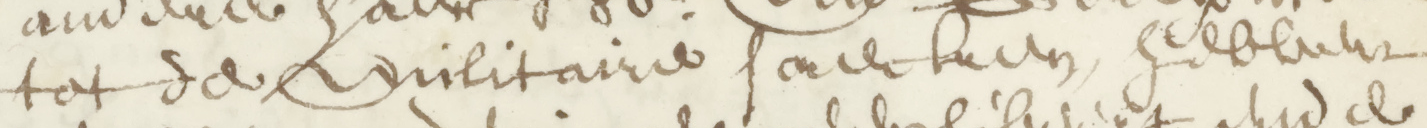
tot de Militaire saecken, hebben
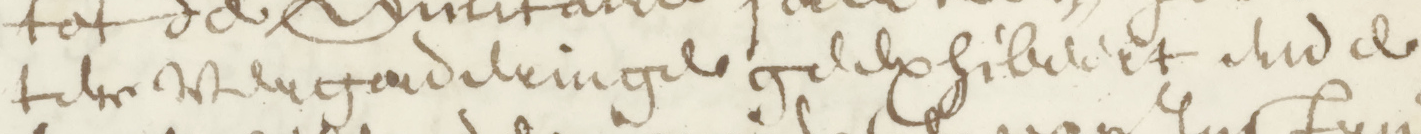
ter Vergaderinge geexhibeert ende
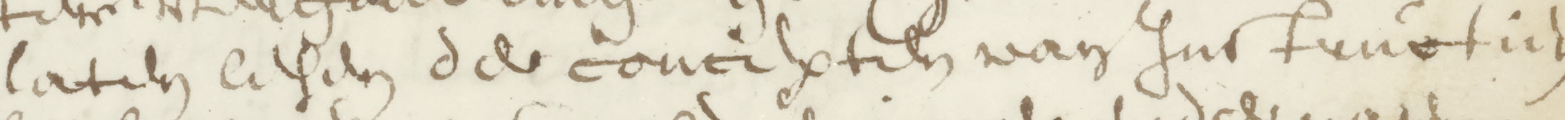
laten lesen de concepten van Instructien
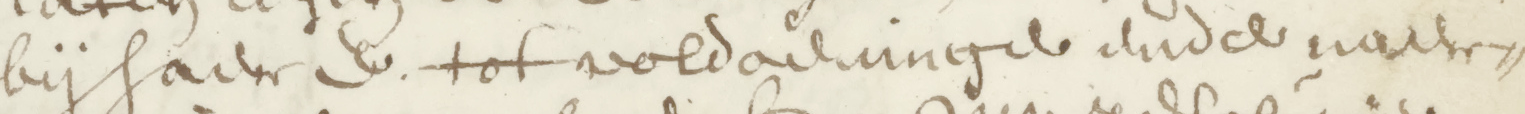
bij haer E. tot voldoeninge ende naer„
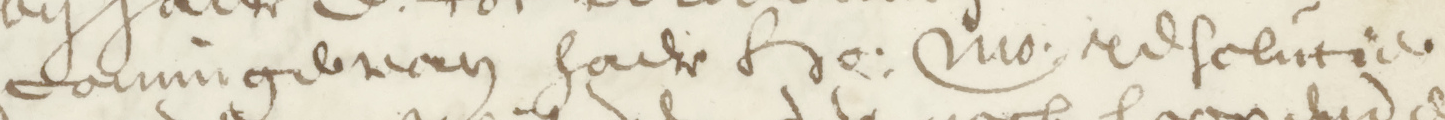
cominge van haer Ho:Mo: resolutie
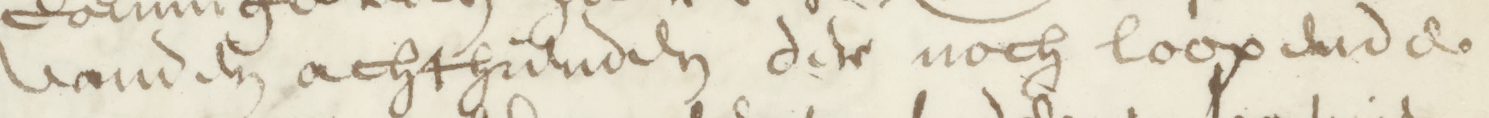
vanden achthienden der noch loopende
